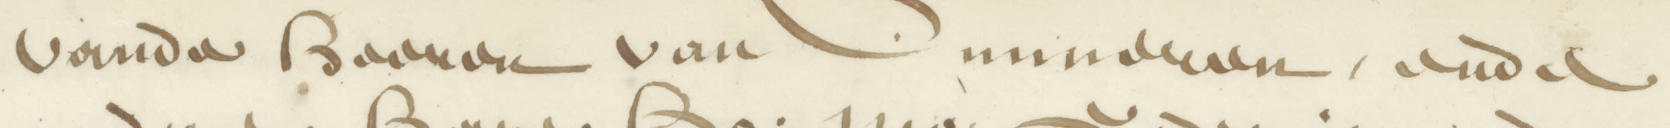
vande heeren van Ommeren ende
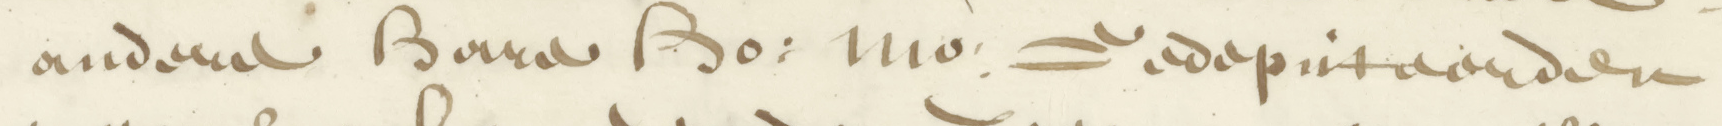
andere hare Ho: Mo: Gedeputeerden
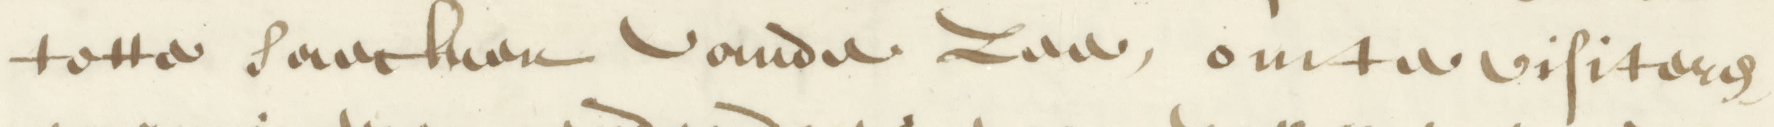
totte saecken vande zee, om te visiteren
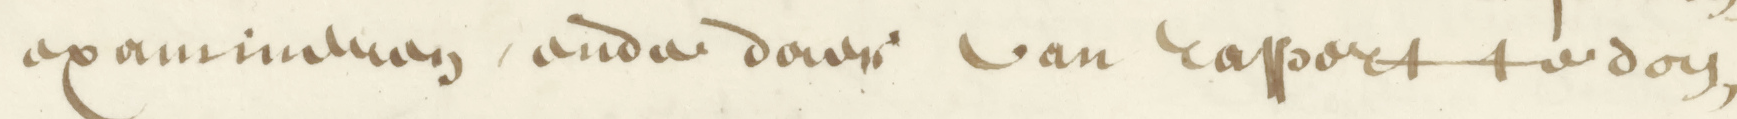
examineren ende daer van rapport te doen.
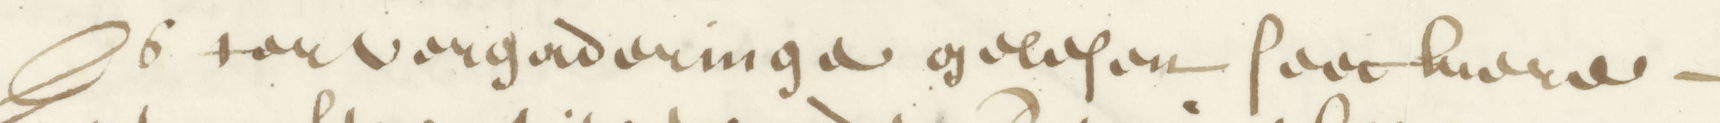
Is ter vergaderinge gelesen seeckere
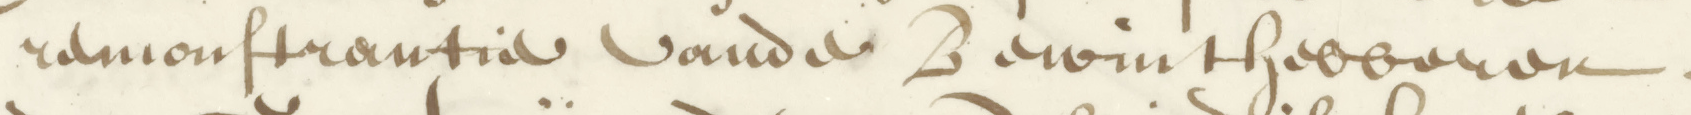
remonstrantie vande Bewinthebberen
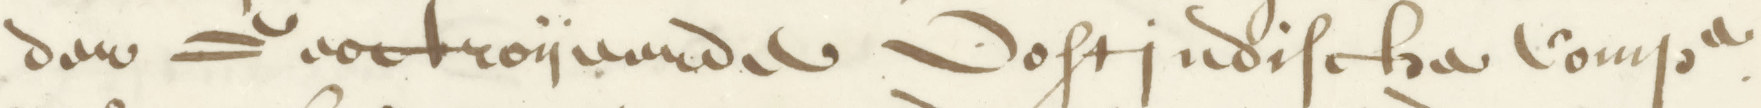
der Geoctroijeerde Oostindische Compe
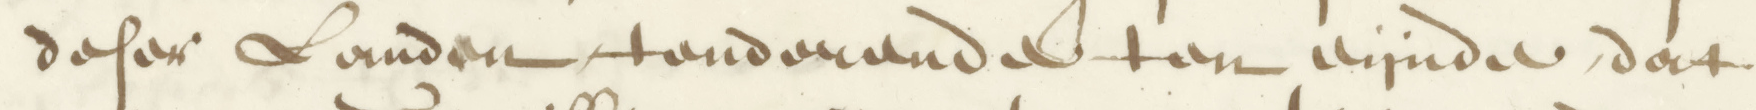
deser Landen, tenderende ten eijnde dat
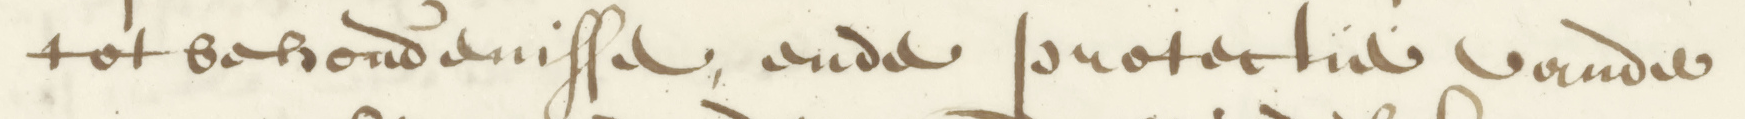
tot behoudenisse ende protectie vande
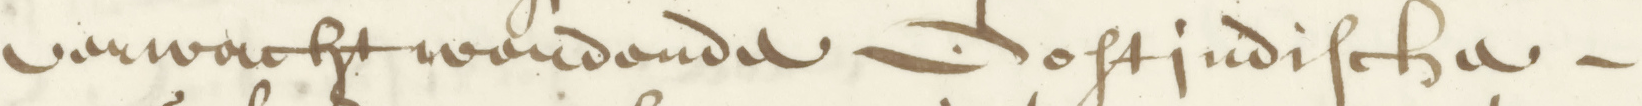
verwacht werdende Oostindische -
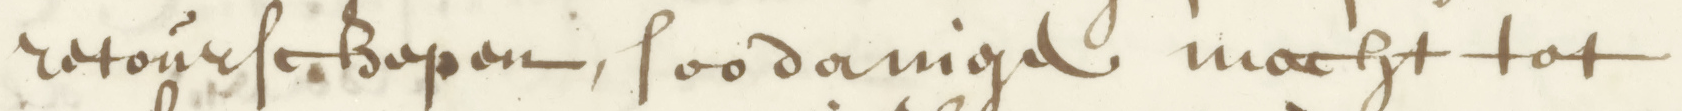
retourschepen, soodanige macht tot
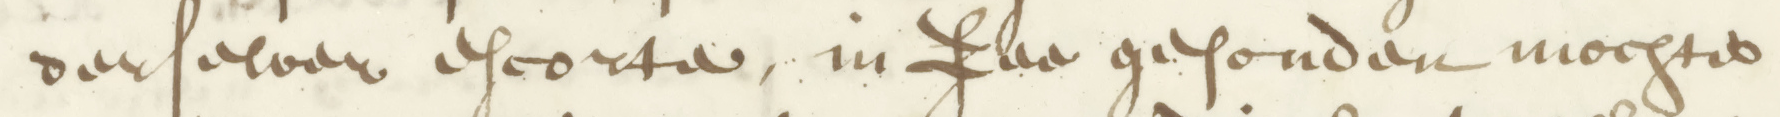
derselver escorte in Zee gesonden mochte
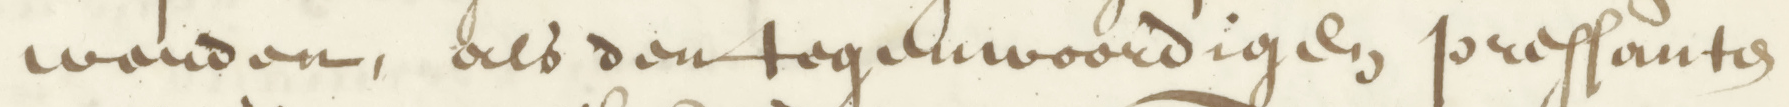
werden, als den tegenwoordigen pressante
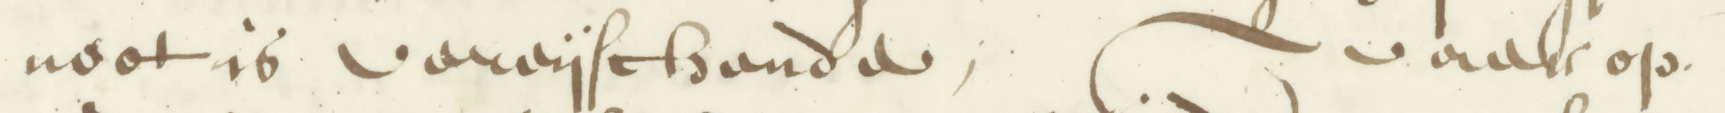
noot is vereijschende. Waer op
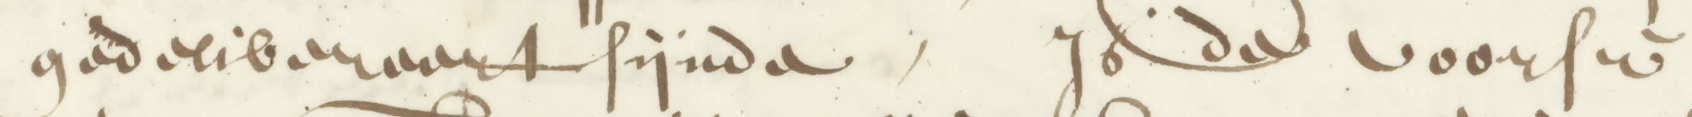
gedelibereert sijnde, Is de voorsr
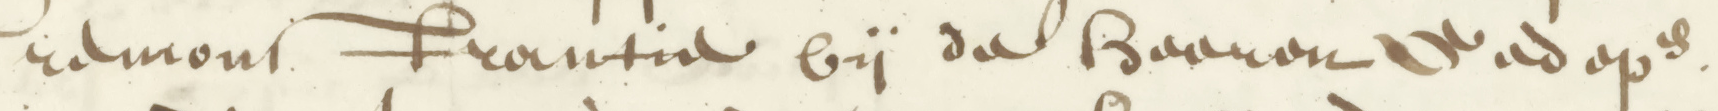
remonstrantie bij de heeren Gedepen
